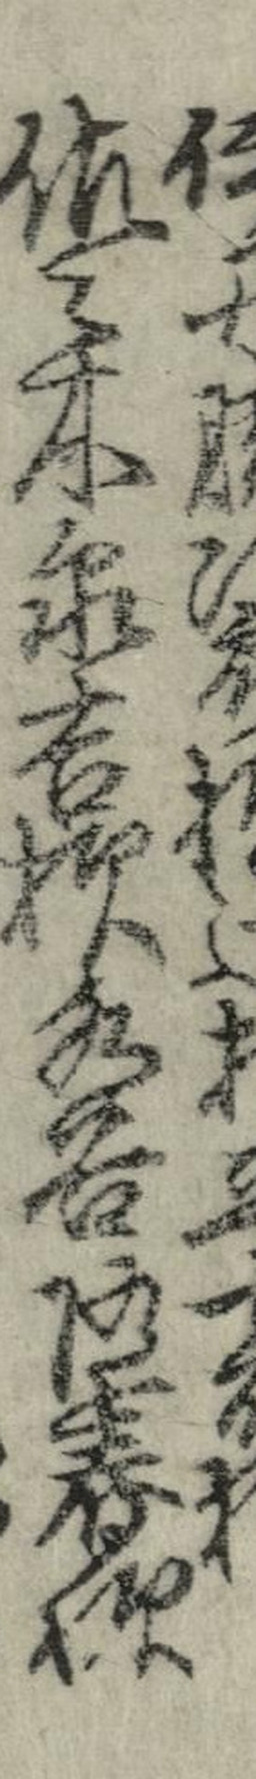佐ゝ木亀吉様水谷随春様
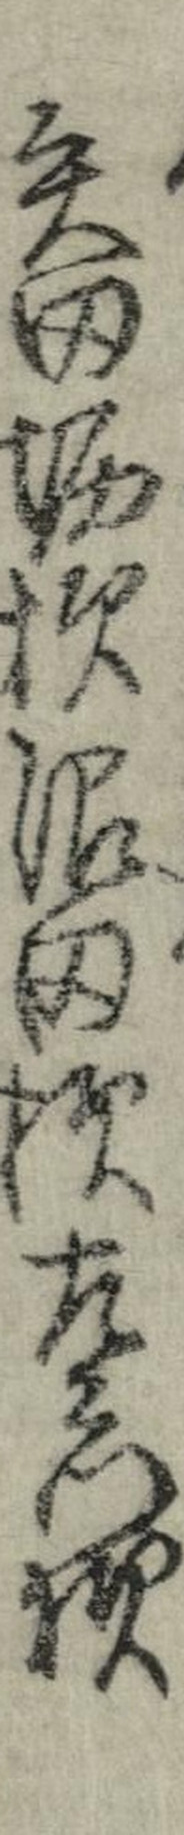矢田場様沼田様左衛門様
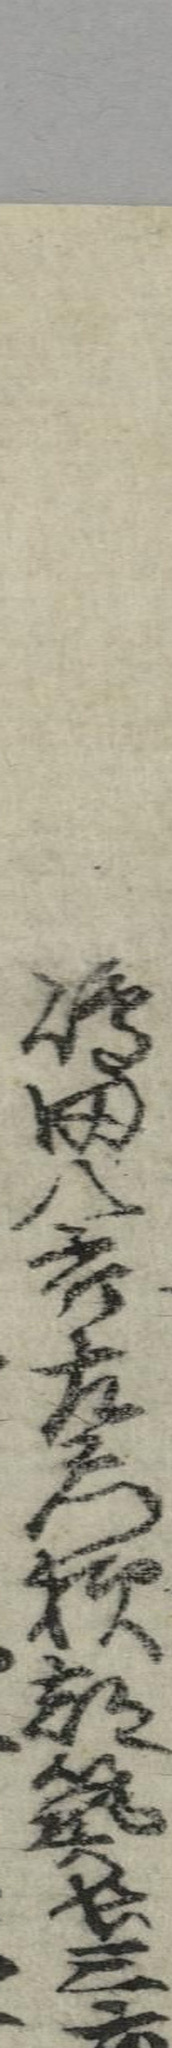嶌田八右左衛門様都筑長三郎様
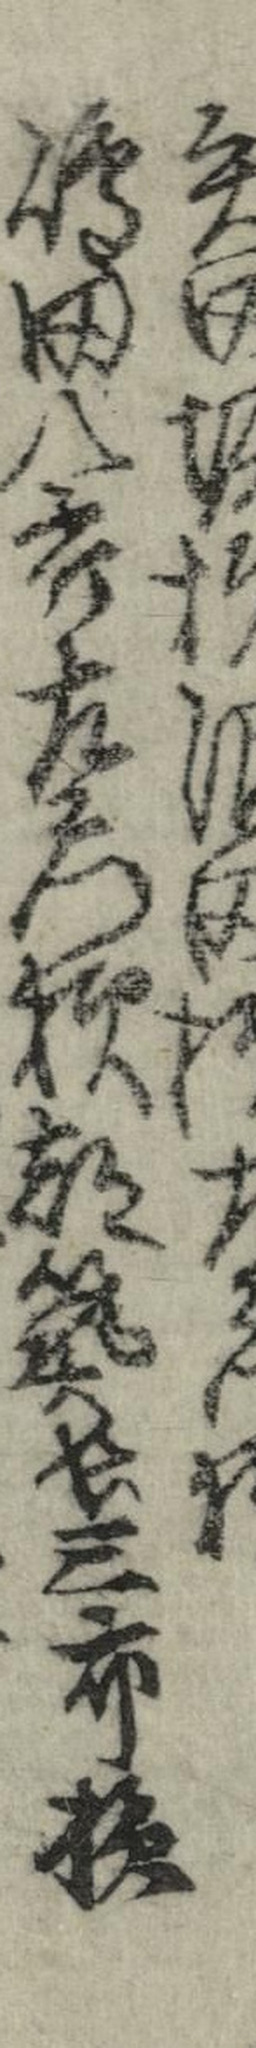嶌田八右左衛門様都筑長三郎様
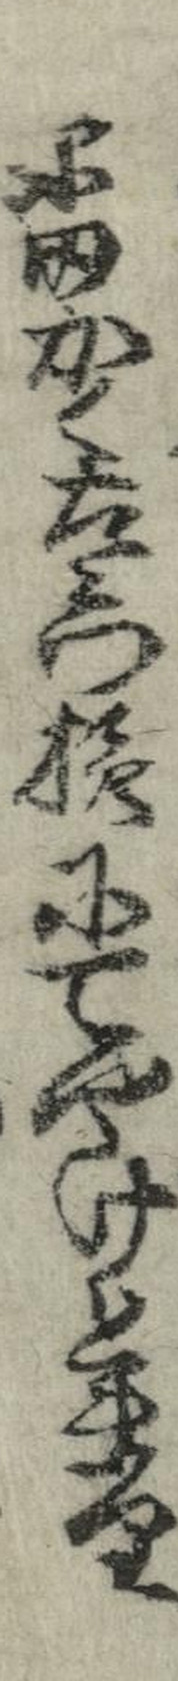田かく左衛門様にてやけとまる
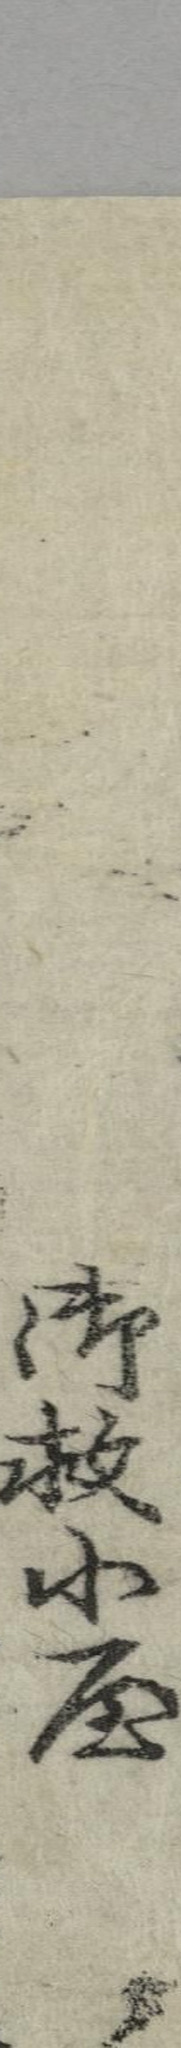御救小屋
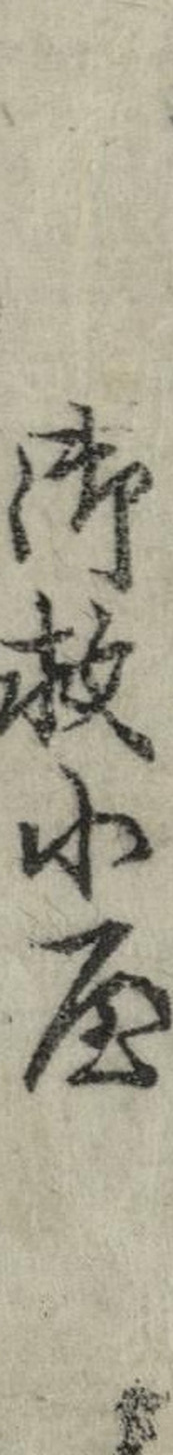御救小屋
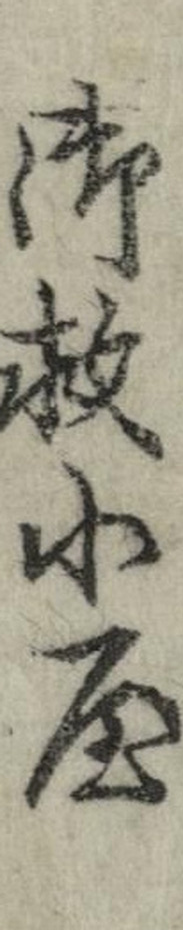御救小屋
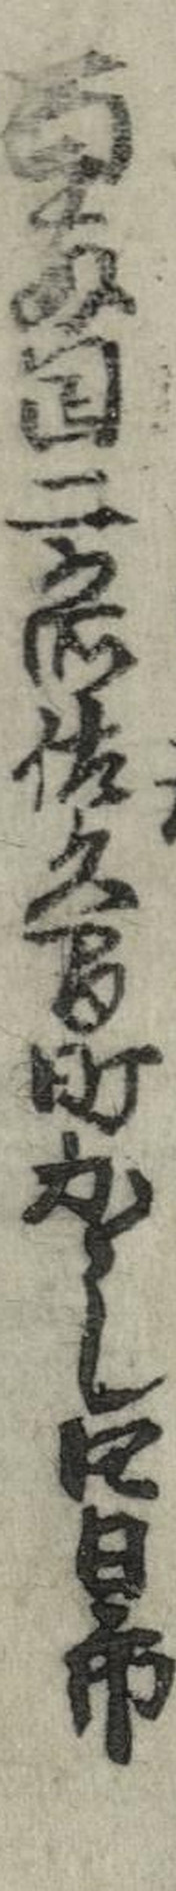西？両国二か所佐久間町かし四日市
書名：方角繪圖面
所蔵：東京大学地震研究所図書室 Earthquake Research Institute Library, The University of Tokyo, JAPAN
